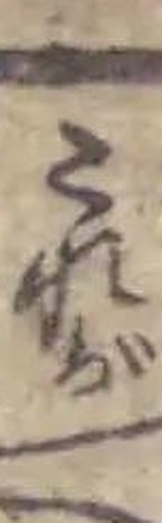これが
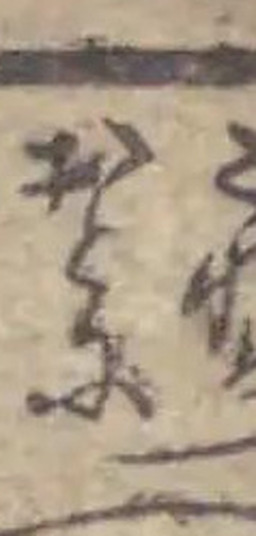おとに
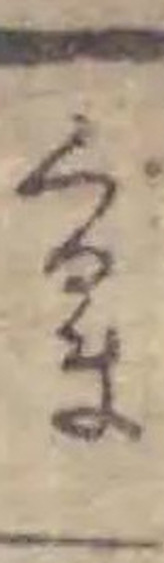くるま
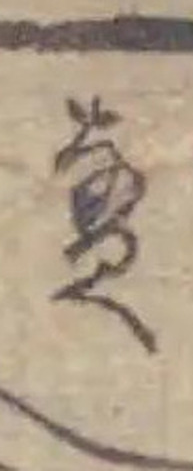なるへ

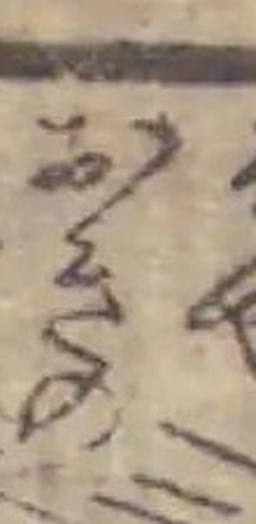おきの
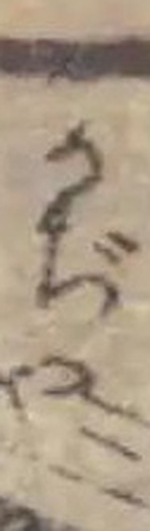かぢや
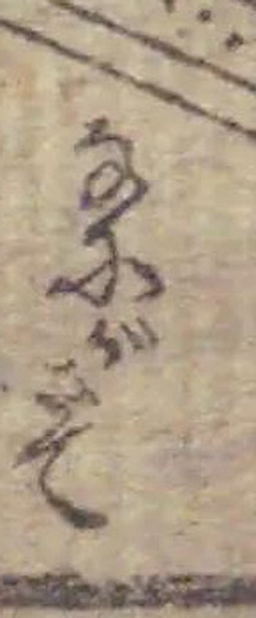なにがさて
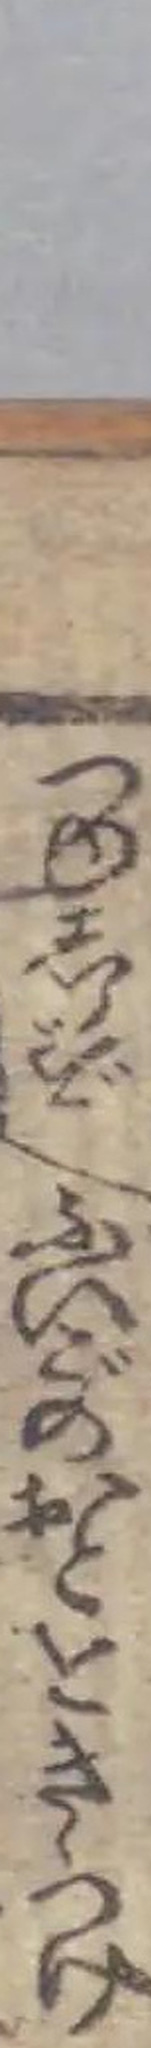つねしらずふいごのおとをきゝつけ
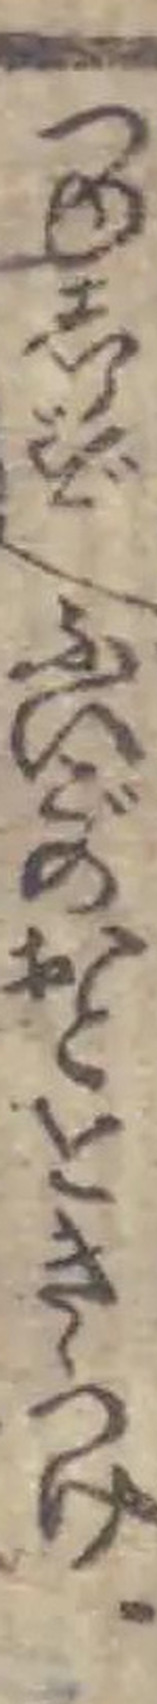つねしらずふいごのおとをきゝつけ
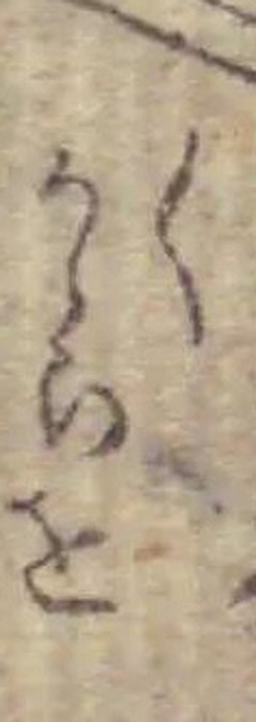かしらを
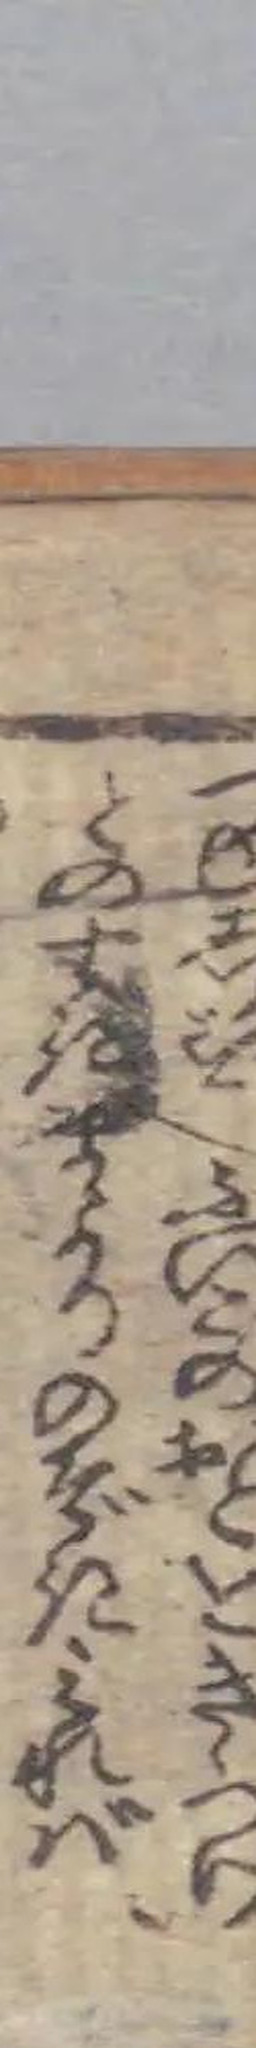とのすきまよりのぞきみれば
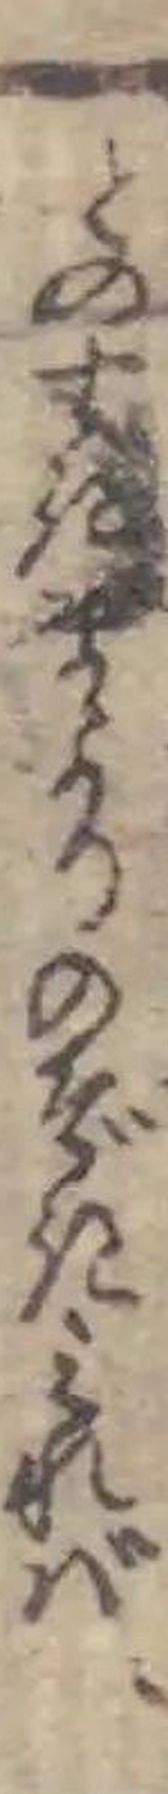とのすきまよりのぞきみれば
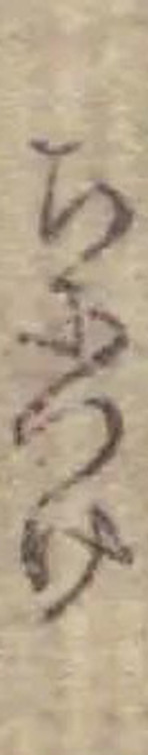ちにつけ
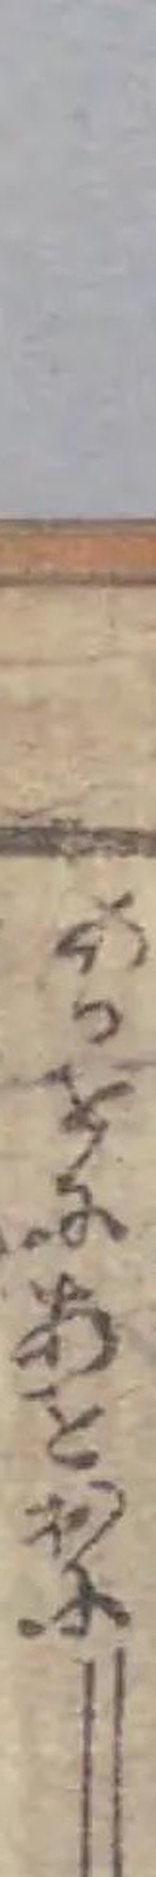あかをにあをおに
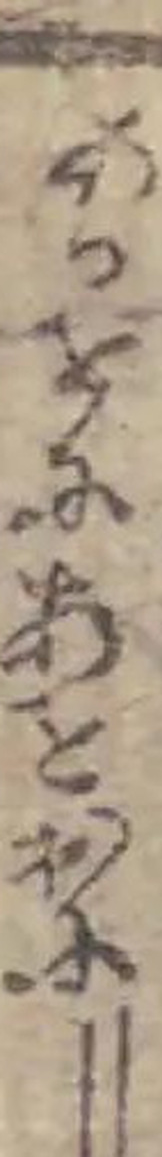あかをにあをおに
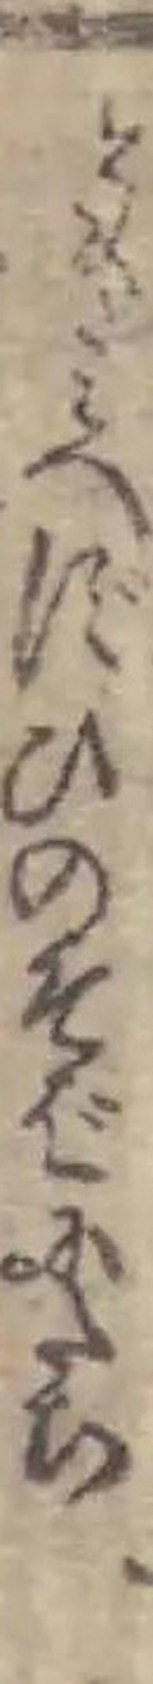ともみへずひのそばにたち
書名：飲中八人前 3巻
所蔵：国立国会図書館 National Diet Library, JAPAN
